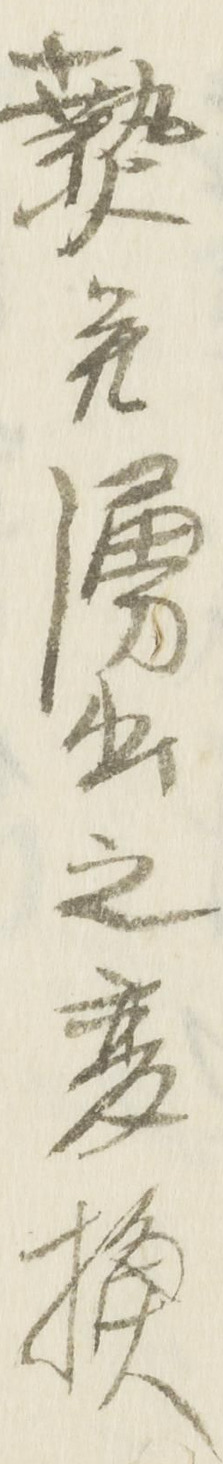熱并湧出之変換
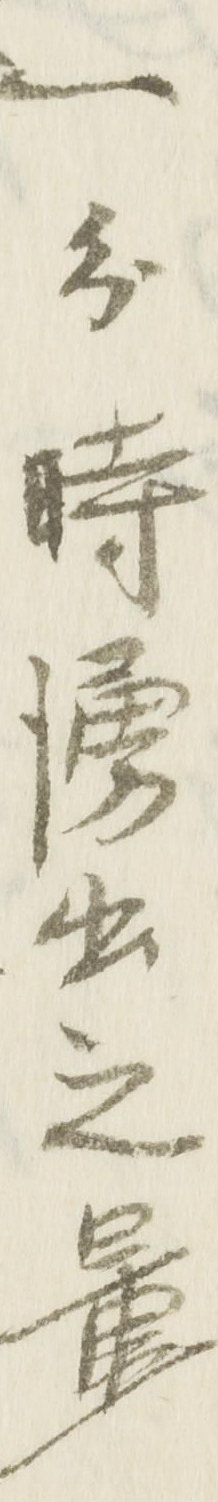一分時湧出之量
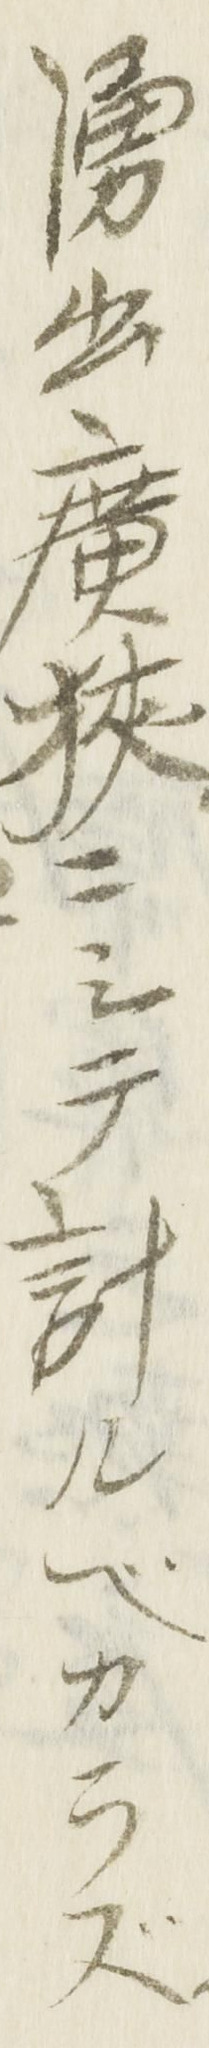湧出広狭ニシテ計ルベカラス
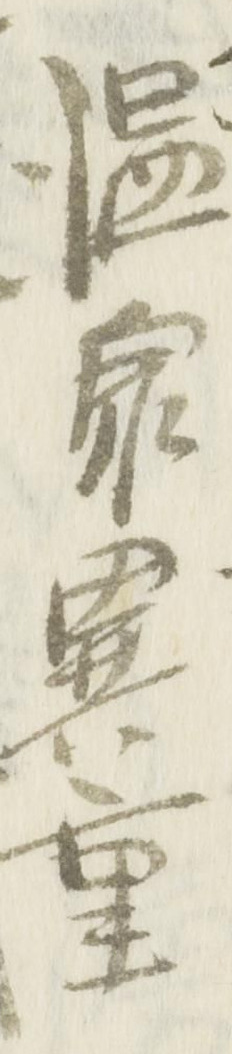温泉異重
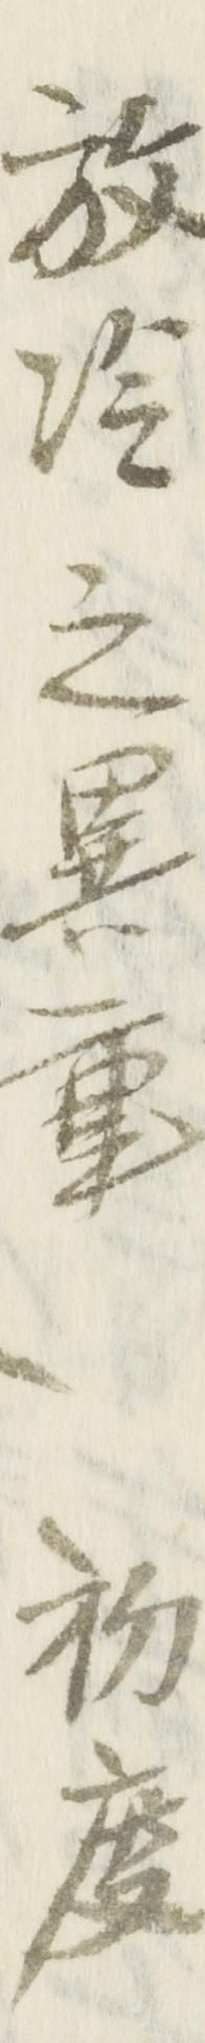放冷之異重初度
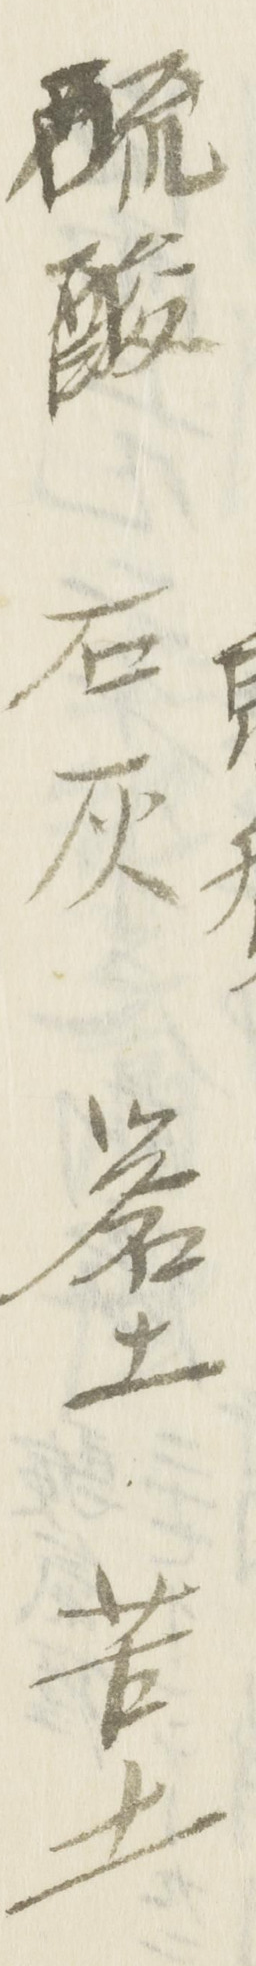硫酸石灰礬土苦土
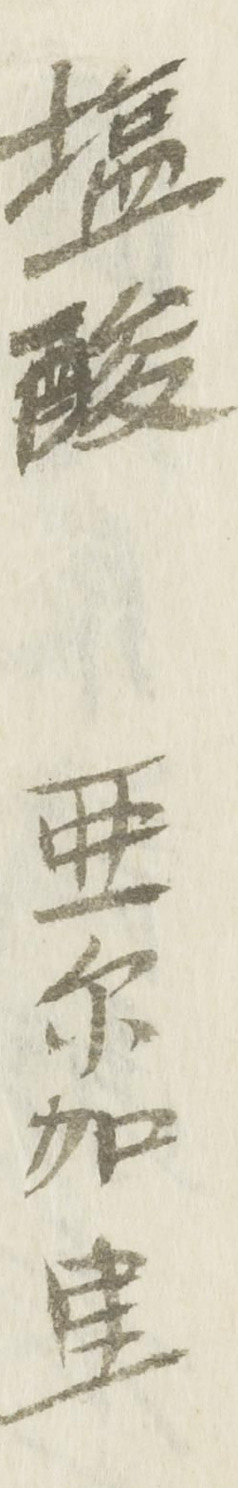塩酸亜尓加里
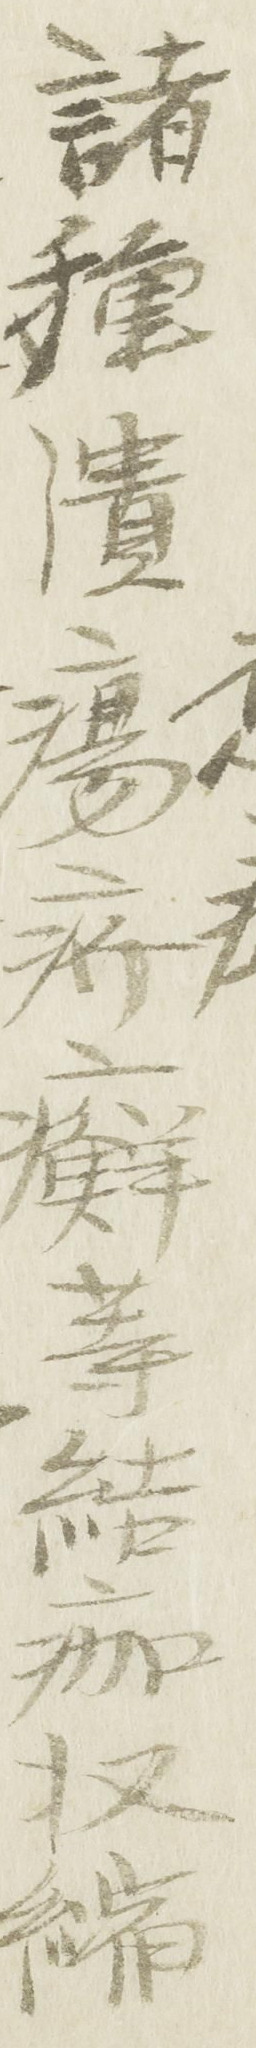諸種潰瘍疥癬等結痂収縮
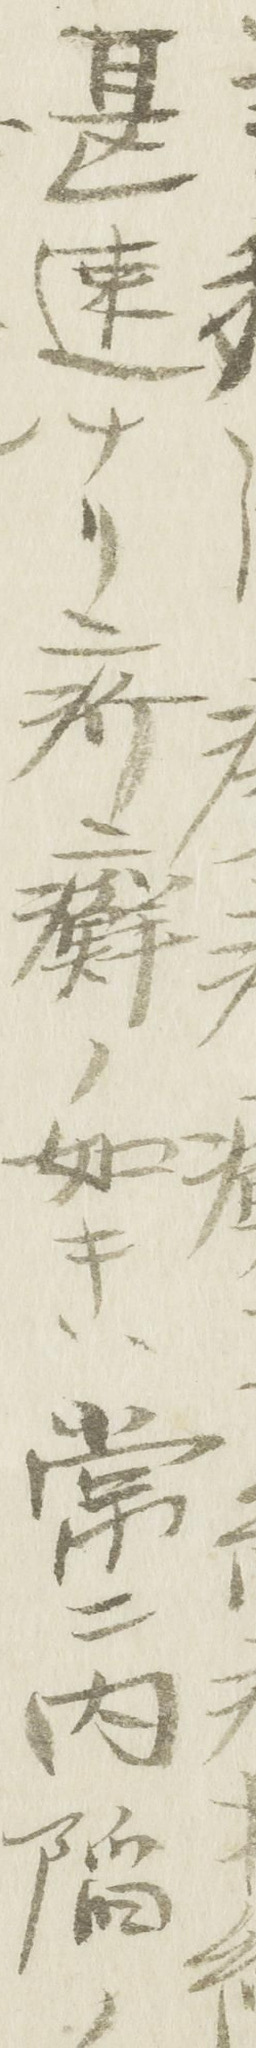甚速ナリ疥癬ノ如キハ常ニ内陥ノ
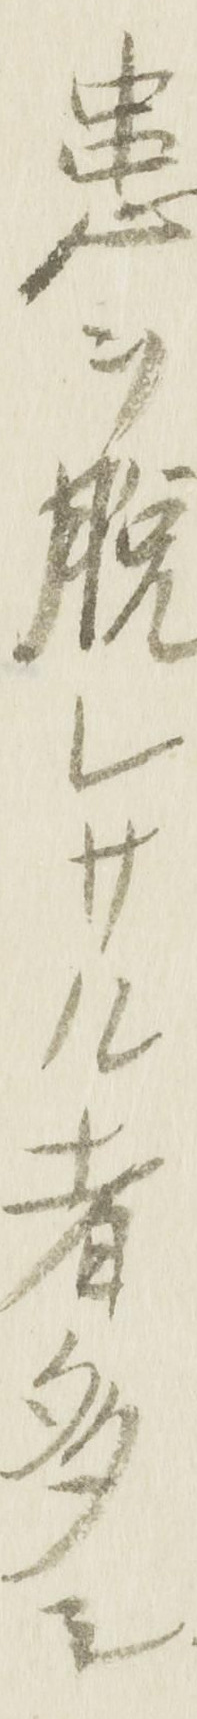患脱レサル者多シ

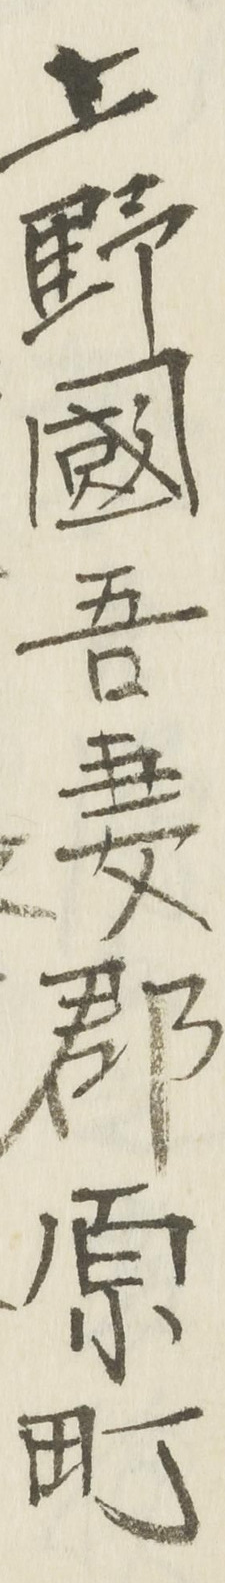上野國吾妻郡原町
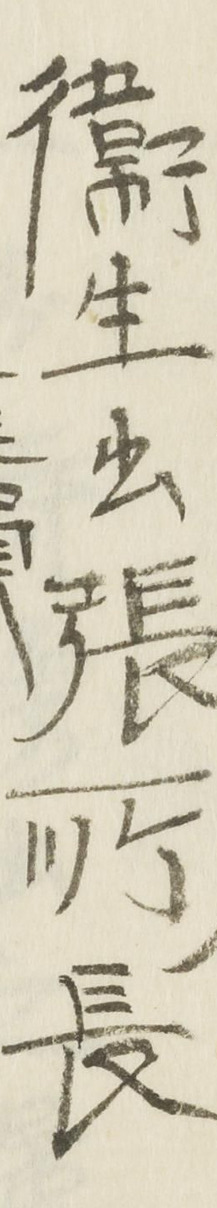衛生出張所長
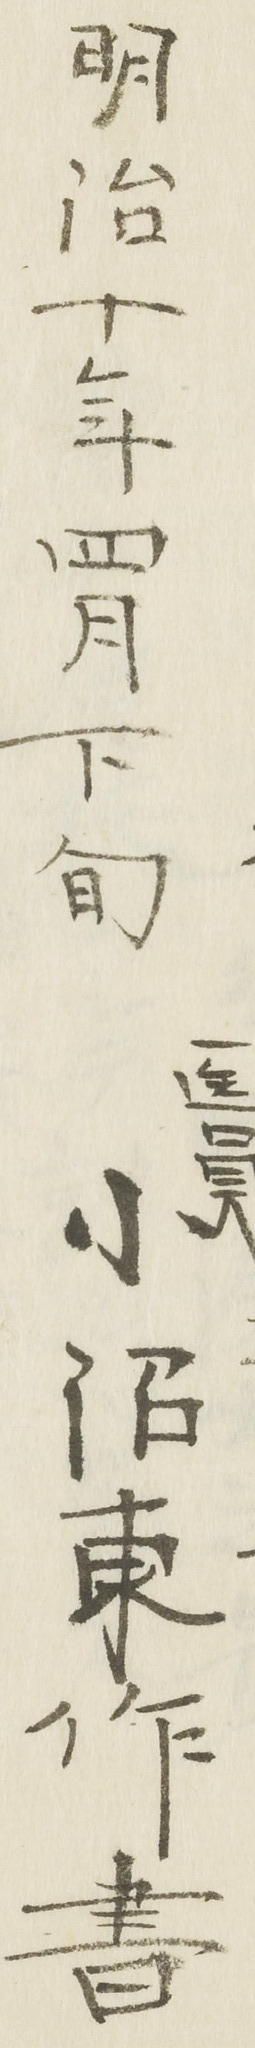明治十年四月下旬医員小沼東作書
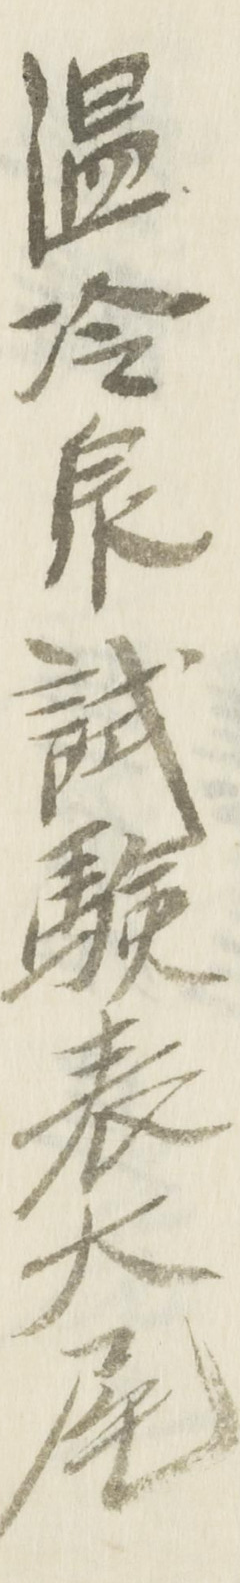温冷泉試験発表大尾
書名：温冷泉試験表
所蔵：東京大学地震研究所図書室 Earthquake Research Institute Library, The University of Tokyo, JAPAN
